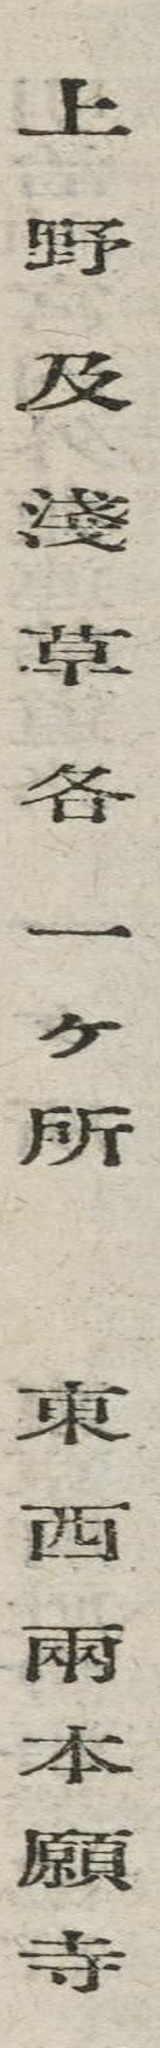同上野及浅草各一ケ所東西西本願寺
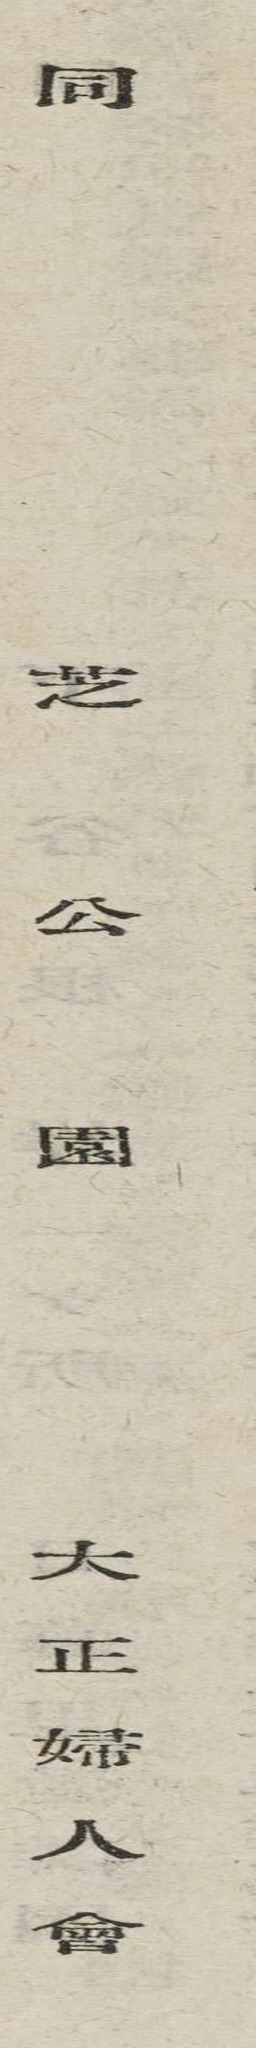同芝公園大正婦人会
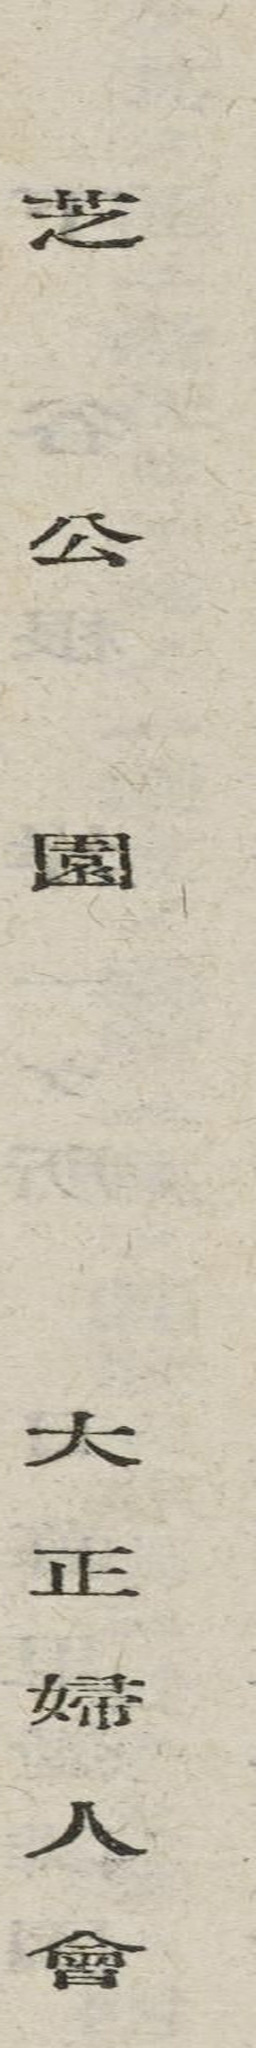同芝公園大正婦人会
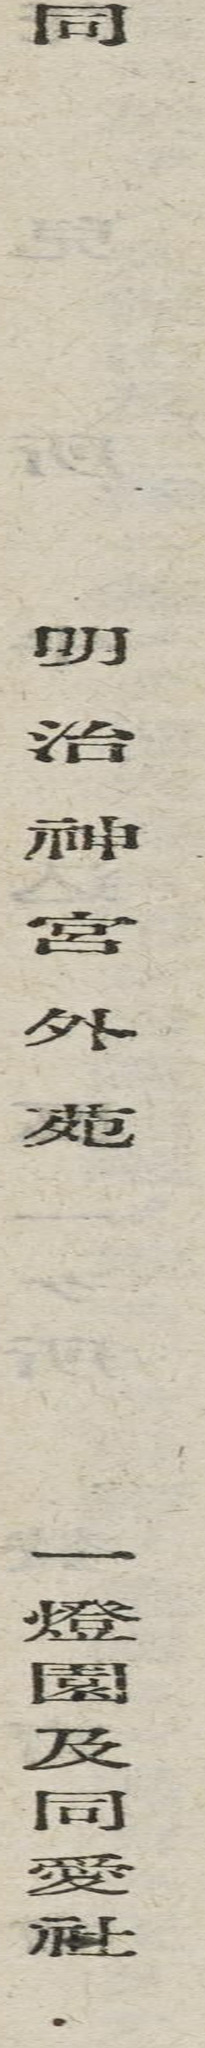同明治神宮外苑一燈園及同愛社
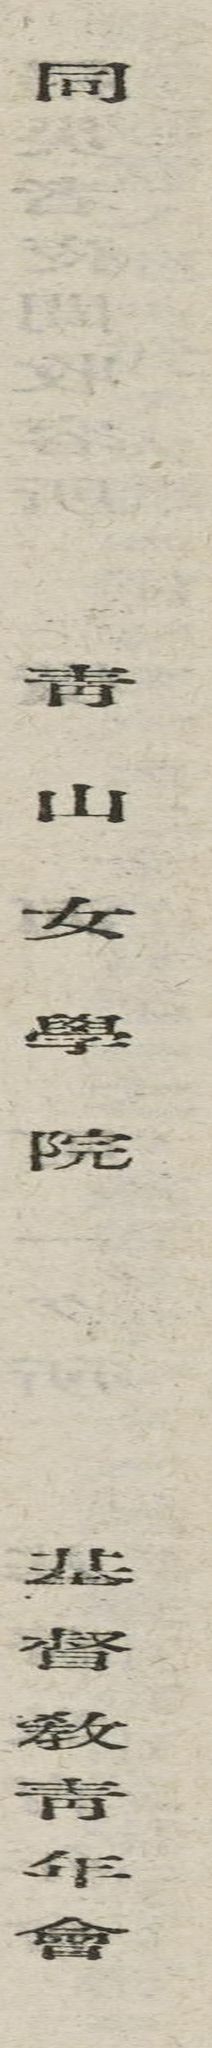同青山女学院基督教青年会
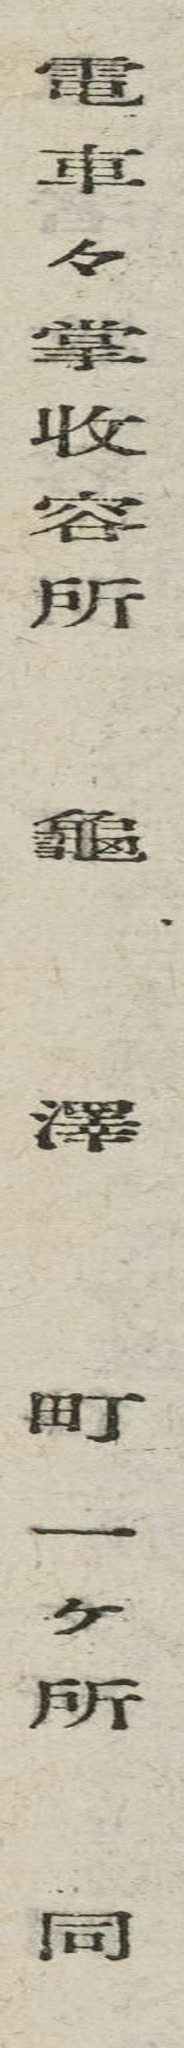電車々掌収容所亀沢町一ケ所同
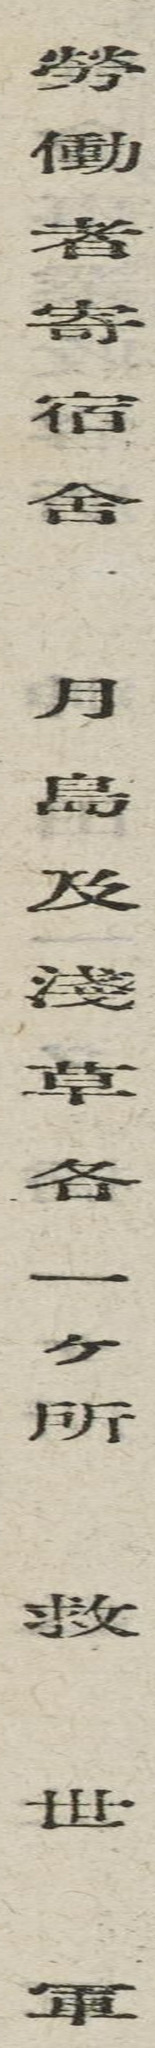労働者寄宿舎月島及浅草各一ケ所救世軍

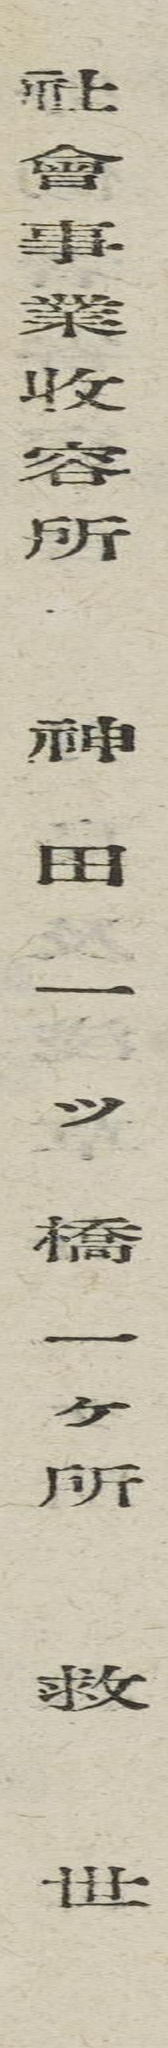社会事業収容所神田一ツ橋各一ケ所救世軍
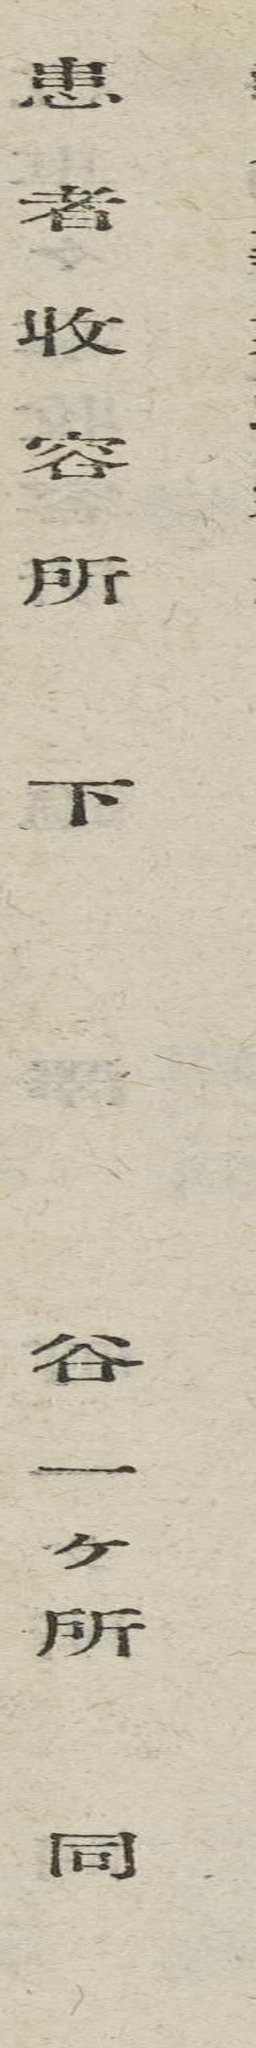患者収容所下谷一ケ所同
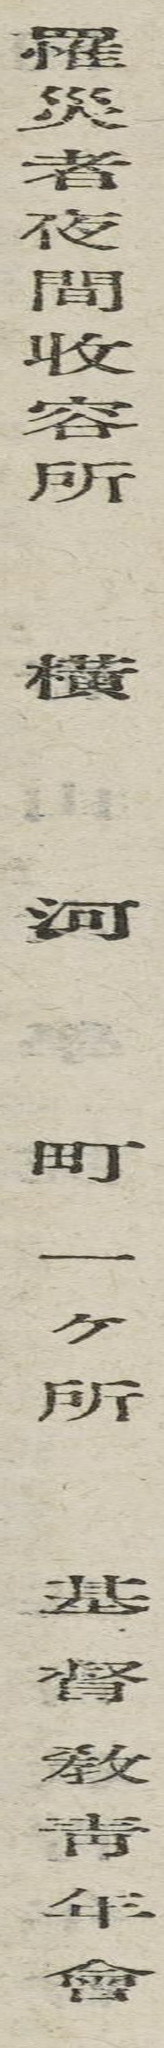罹災者夜間収容所横河町一ケ所基督教青年会
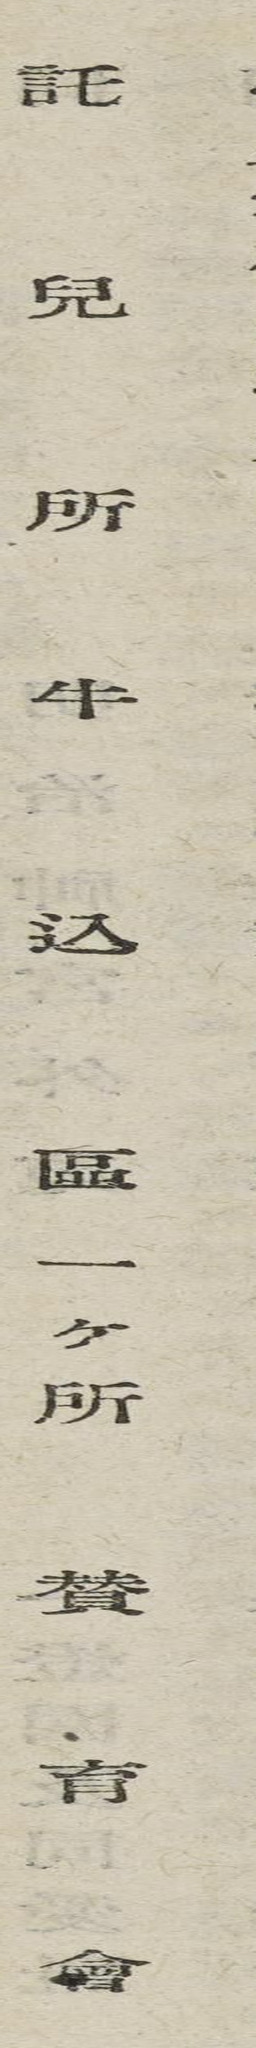託児所牛込区一ケ所養育会
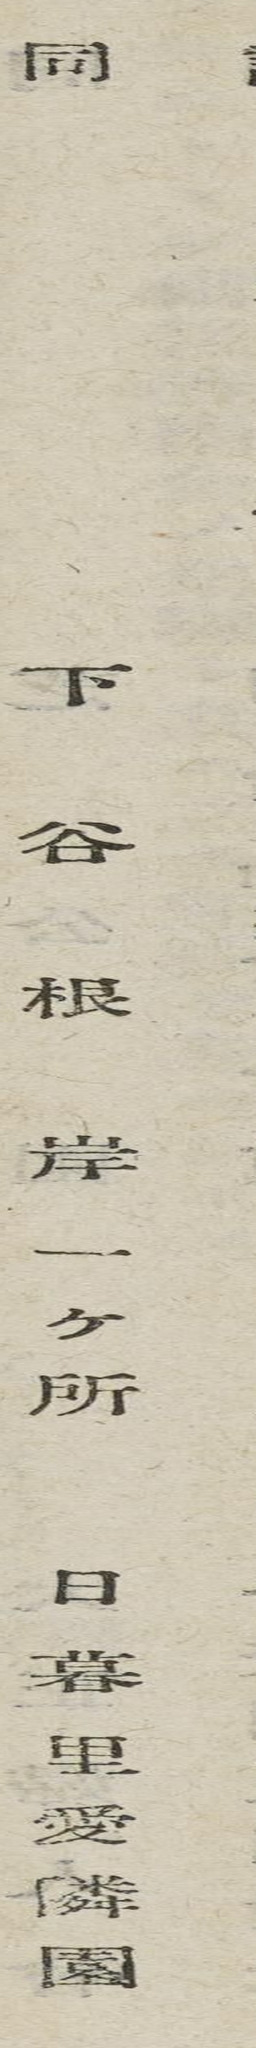同下谷根岸一ケ所日暮里愛粦園
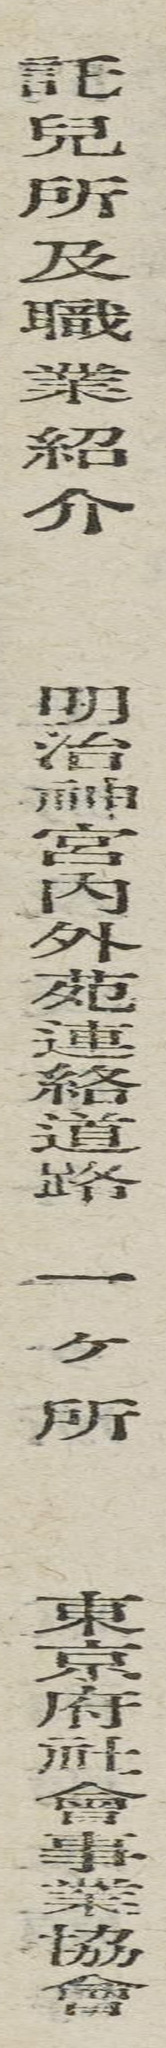託児所及職業紹介明治神宮内外苑連絡道路一ケ所東京府社会事業協会
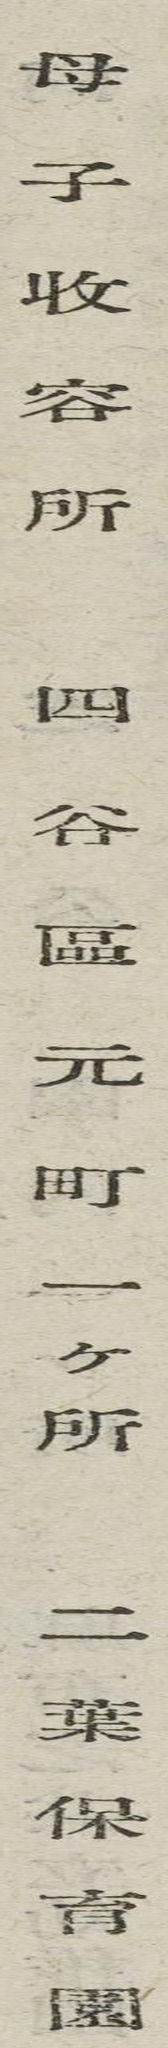母子収容所四谷区元町一ケ所二葉保育園
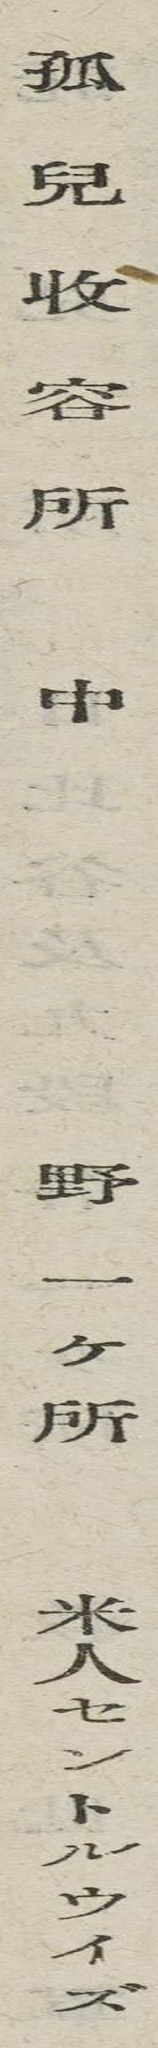孤児収容所中野一ケ所米人セントルウイズ
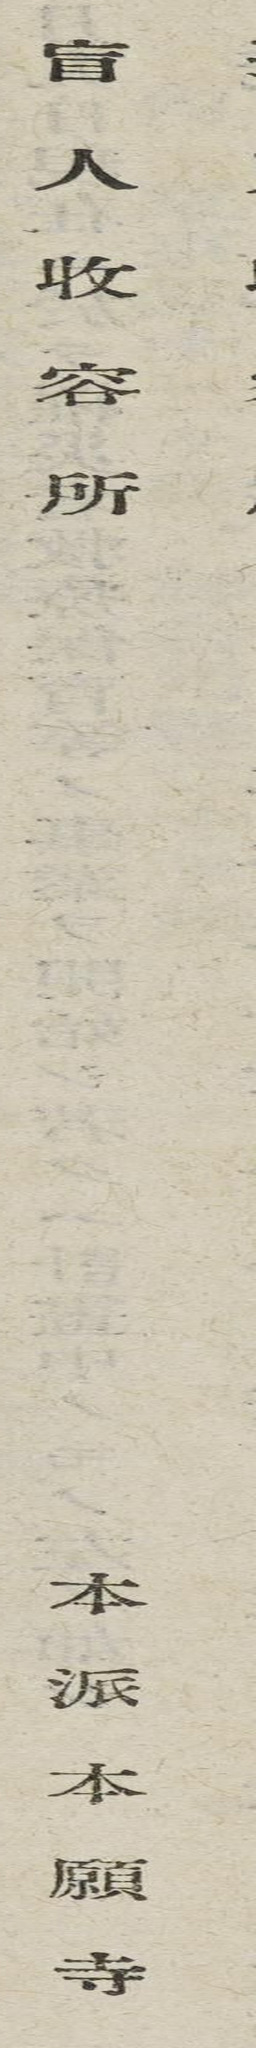盲人収容所本派本願寺
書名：震災被害状況並救護施設概要
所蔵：東京大学地震研究所図書室 Earthquake Research Institute Library, The University of Tokyo, JAPAN
